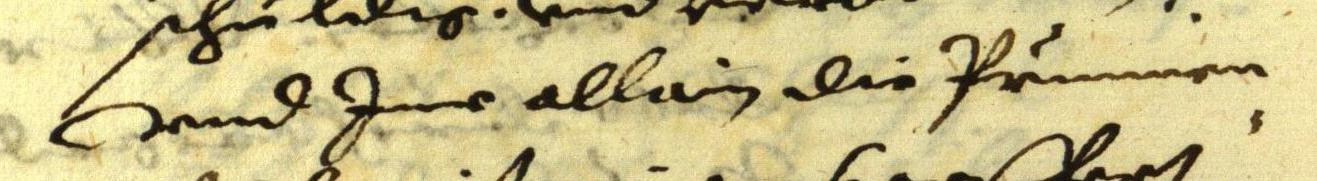vnd Ime allain die Prūnnen
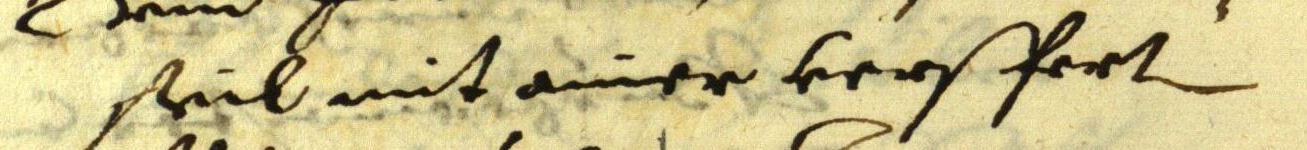sovil mit ainer versPert
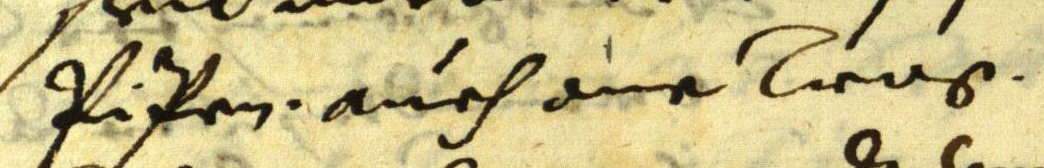PiPen. aūch one Trog.
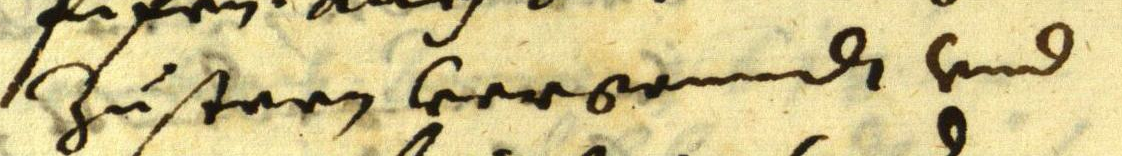Zūsteen vergonndt vnd
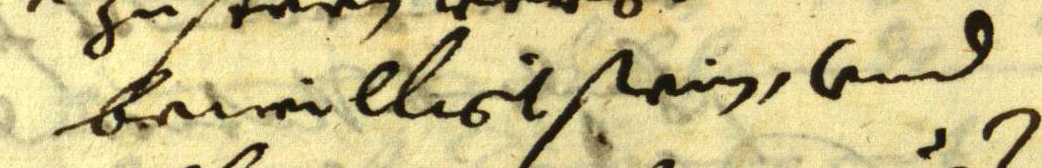bewilligt sein, vnd
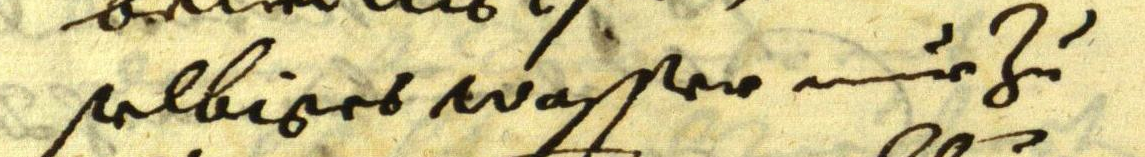selbiges Wasser nūr Zū
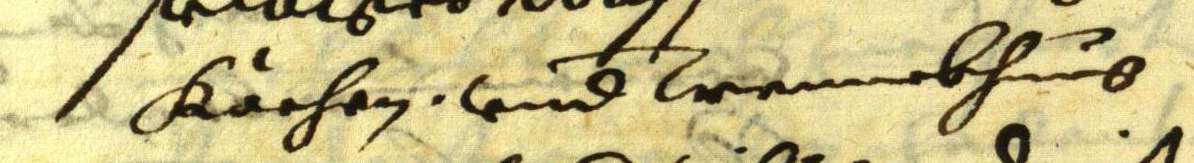Kochen. vnd Trennckhūng
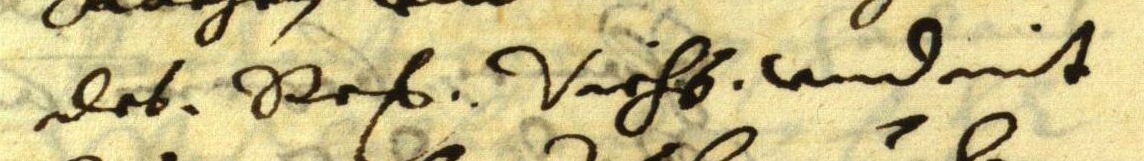des Re Viehs. vnd nit
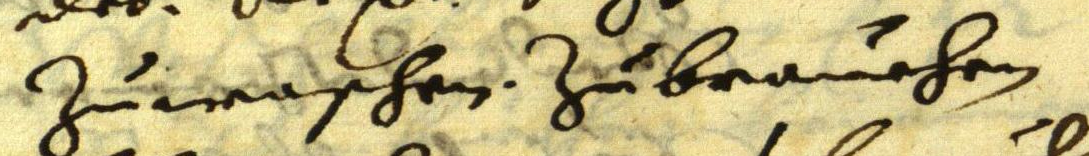Zū waschen. Zū braūchen
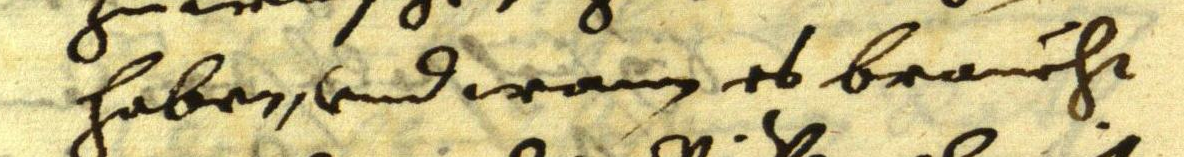haben, vnd wann es braūcht
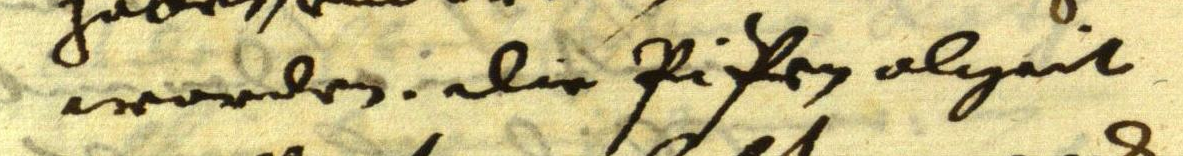worden. die PiPen alzeit
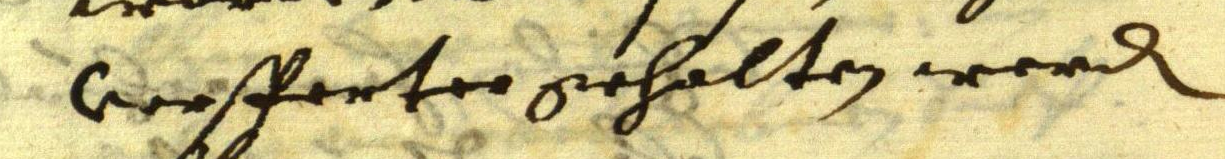versPerter gehalten werd
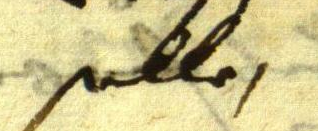solle,
